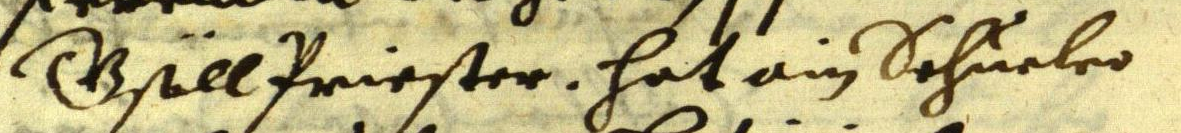Gsöll Priester. hat ain Schūeler
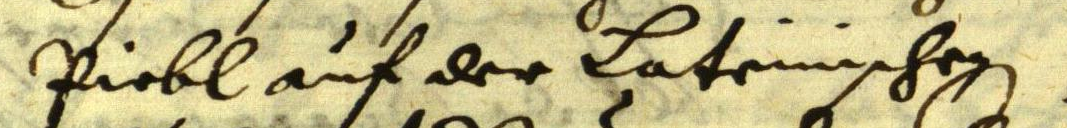Piebl aūf der Lateinischen
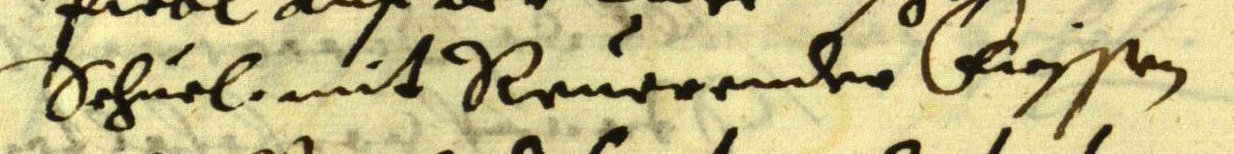Schūel. mit Reūerender Fiessen
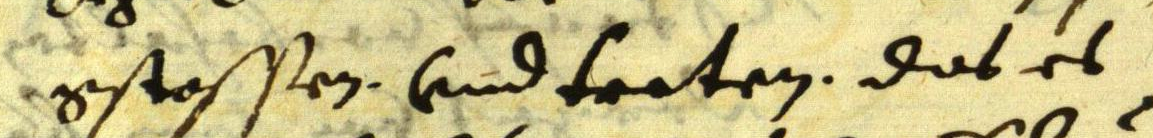gestossen. vnd treten. das es
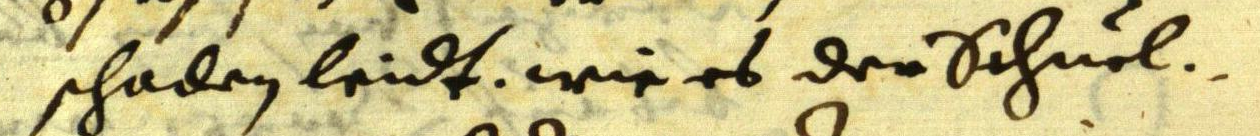Schaden leidt. wie es der Schūel¬
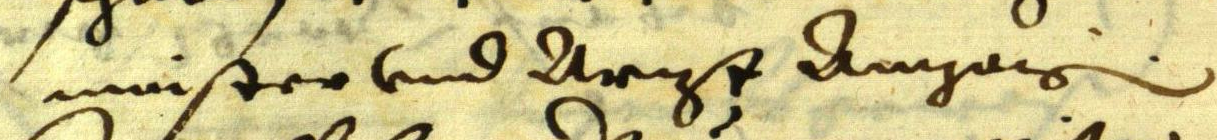maister vnd Arzt Anzaig.
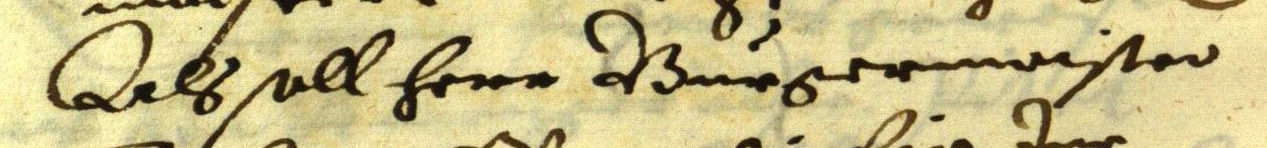Als soll herr Būrgermaister
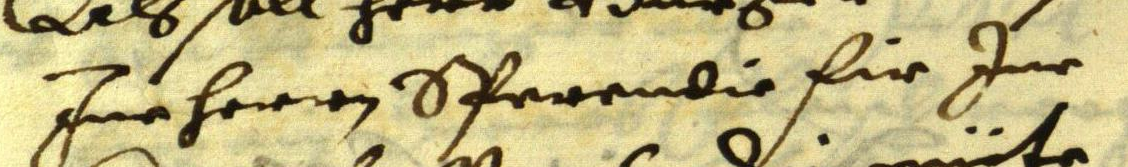Ime herrn Sperendie fir Ime
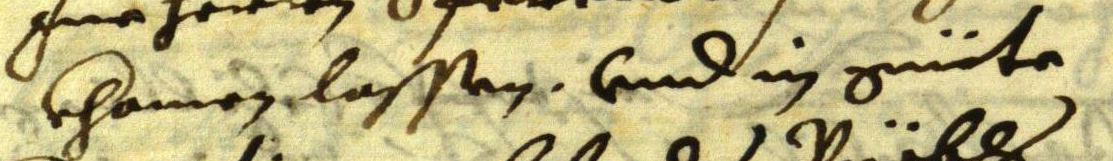khomen lassen. vnd in güete
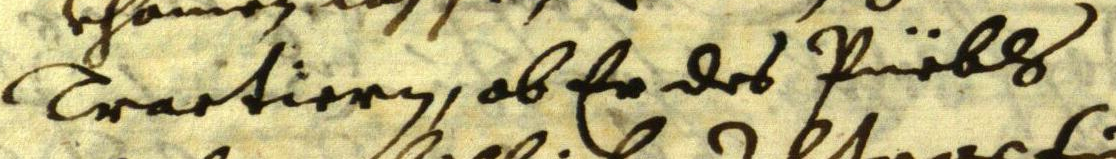Tractiern, ob Er des Püebls
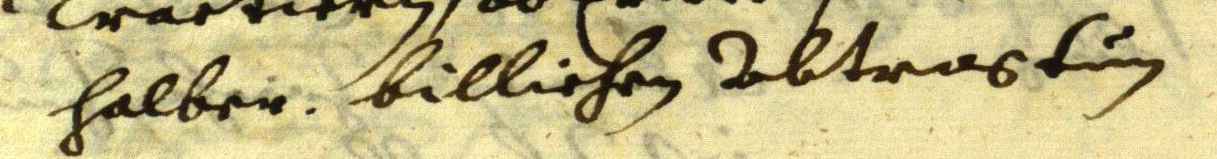halber. billichen Abtrag tūn
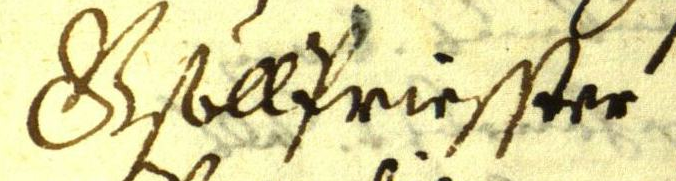Gsōll Priesster
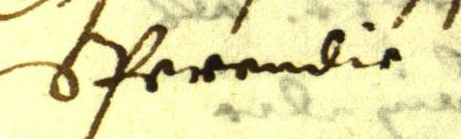Sperendie
